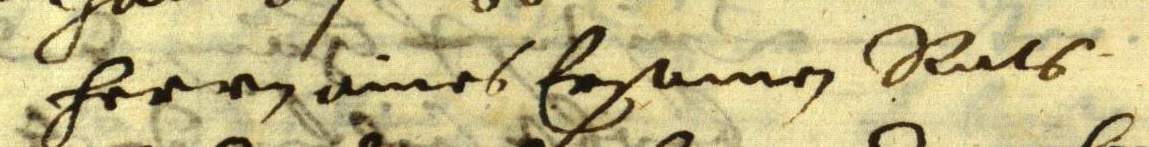herrn aines Ersamen Rats
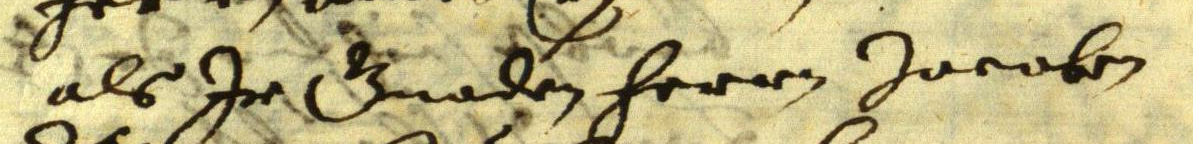als Ir Gnaden herrn Jacoben
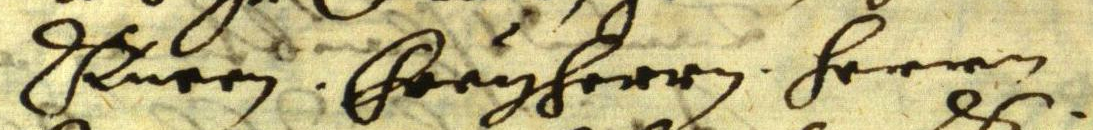Kūeen. Freȳherrn. herrn
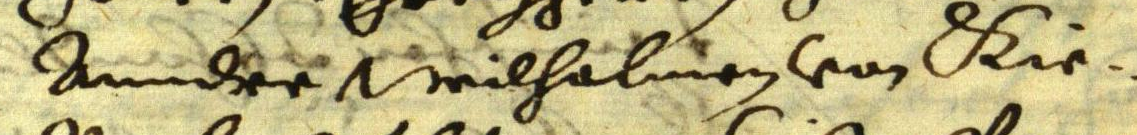Anndre Wilhalmen von Kie¬
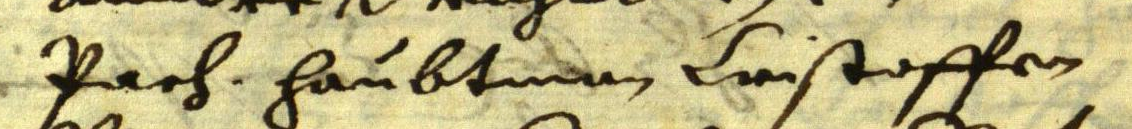Pach. haūbtman Cristoffen
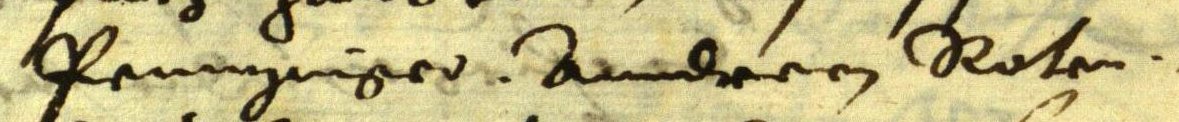Pennzinger. Anndreen Roten¬
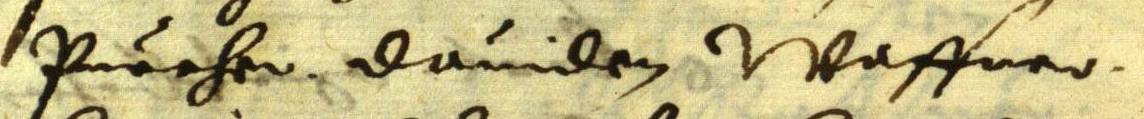Pūecher. Daūiden Waffner.
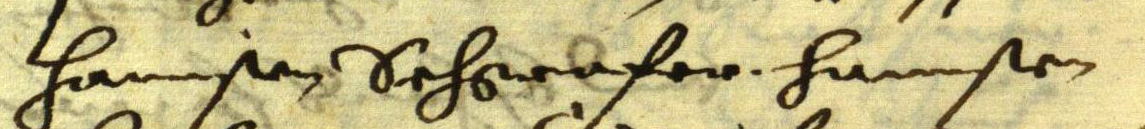hannsen Schgrafer. hannsen
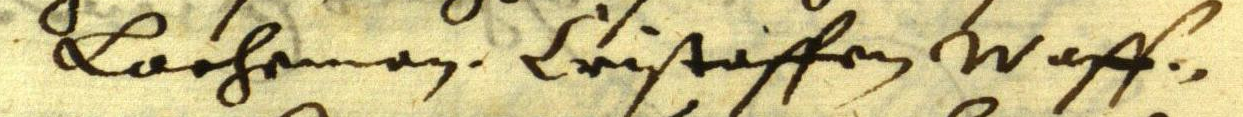Locheman. Cristoffen Waff¬
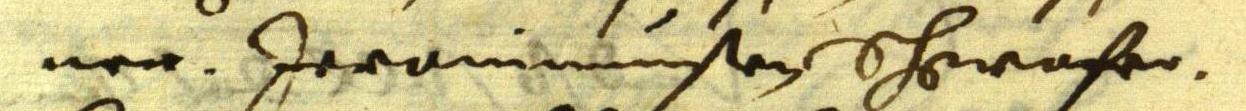ner. Jeronimūsen Schgrafer.
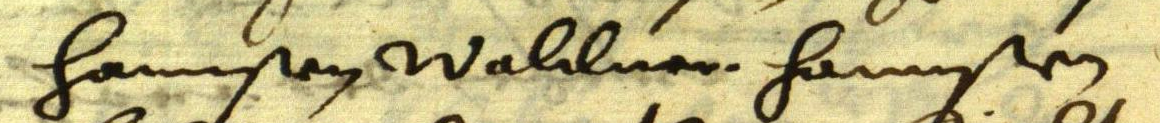hannsen Waldner. hannsen
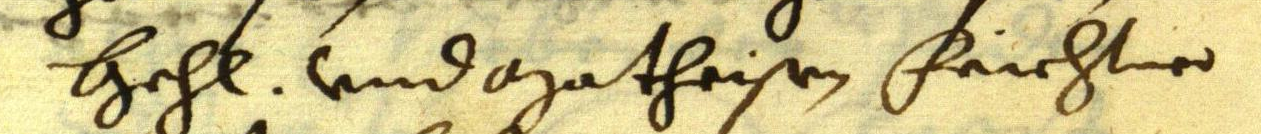Hehl. vnd Matheisen Feichtner
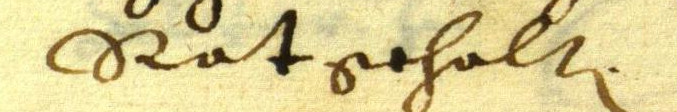Rat gehalt.
